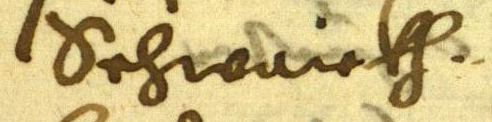Schwaickh¬
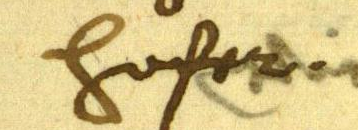hofer.
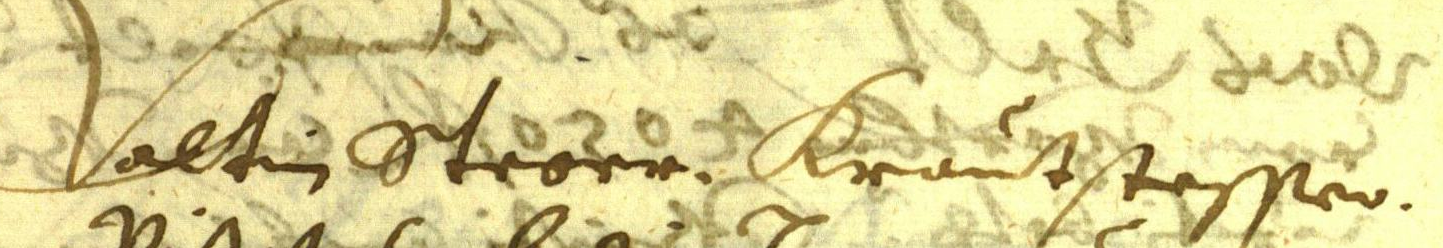Valtin Steger. Kraūtstesser.
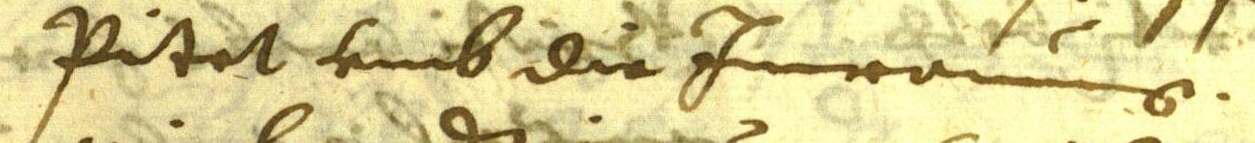Pitet vmd die Inwonūng.
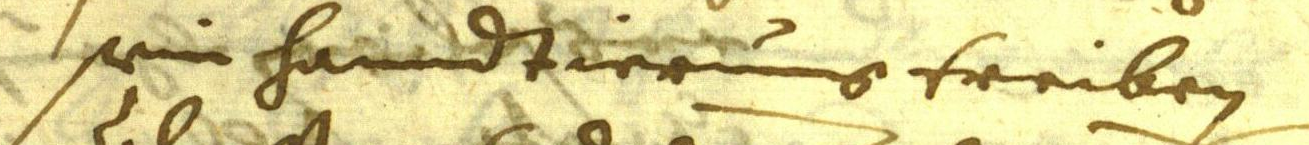sein hanndtierūng treiben
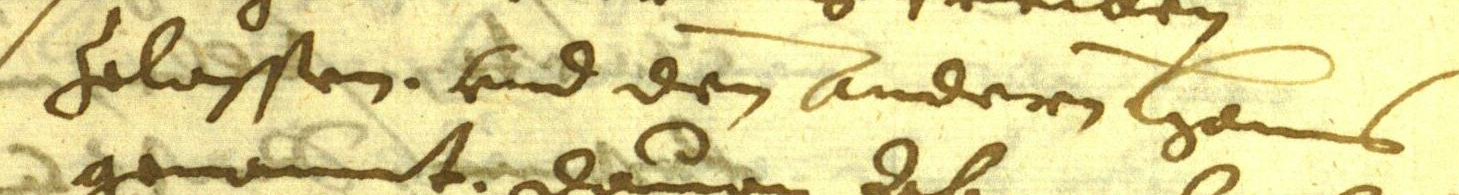Zelassen. vnd den Andern Hanns
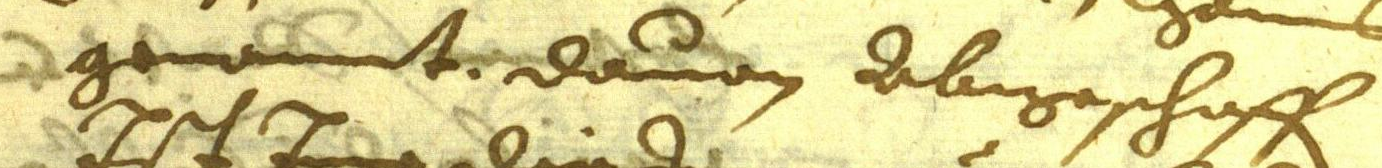genannt. davon Abzeschaff.
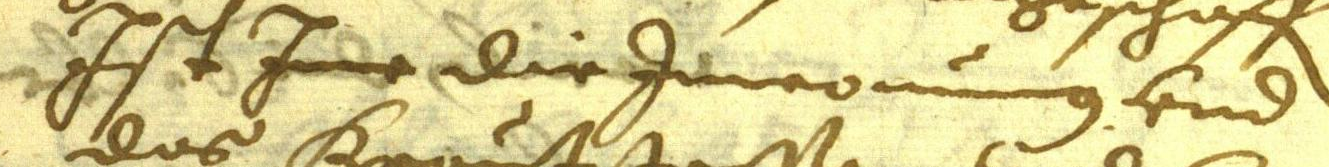Ist Ime die Inwonūng vnd
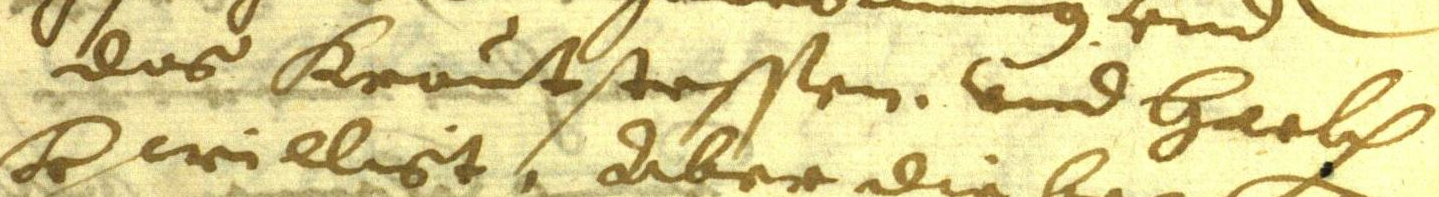das Kraūtstessen. vnd Hackh
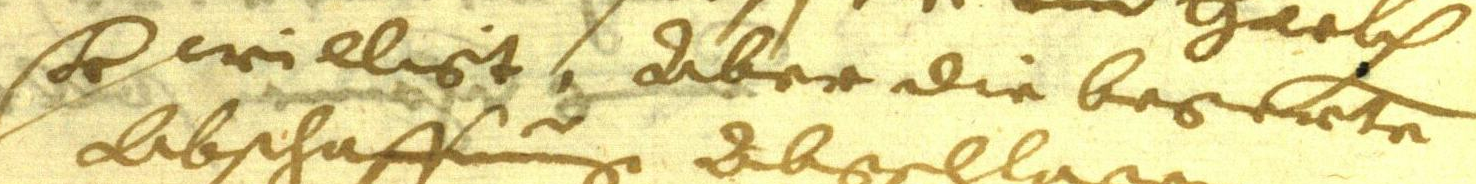gewilligt, Aber die begerte
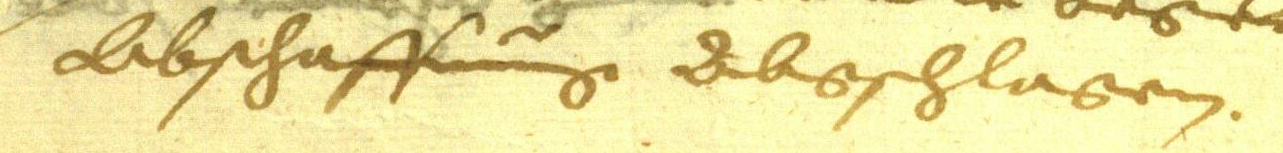Abschaffūng abgschlagen.
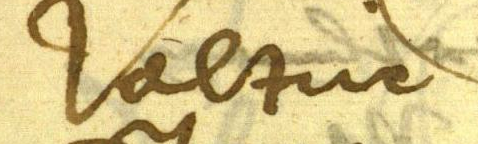Valtin
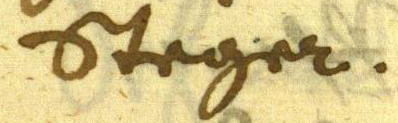Steger.
